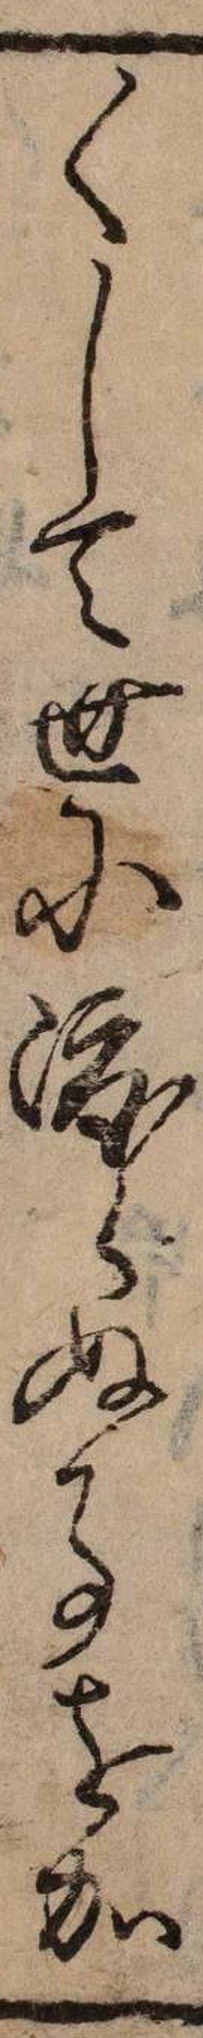くして世に渡らぬ事をか
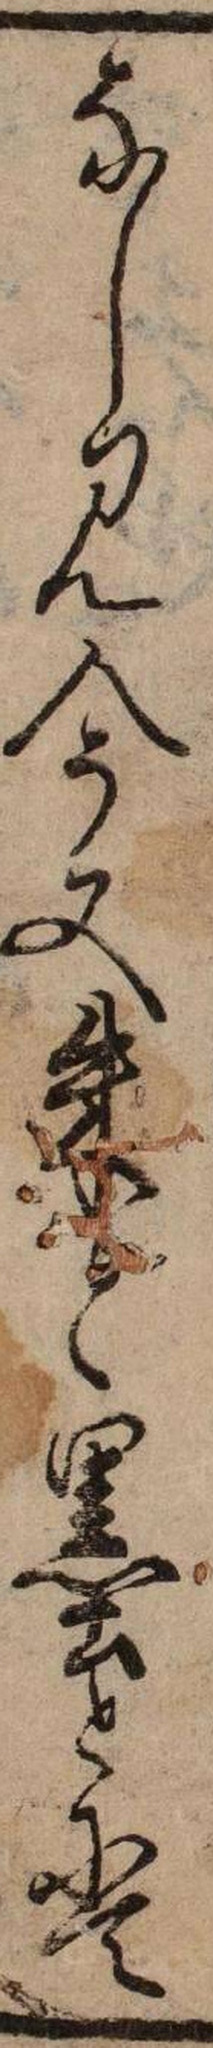なしみ今又朱と墨とにて

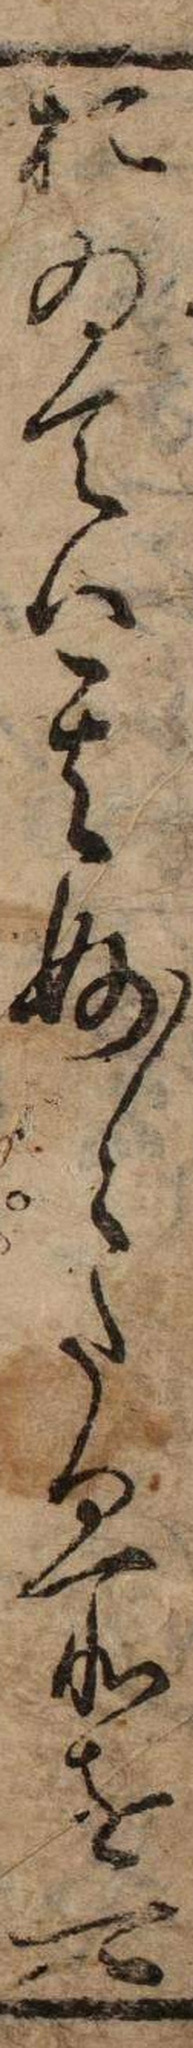おゐては其妙々たる所を可
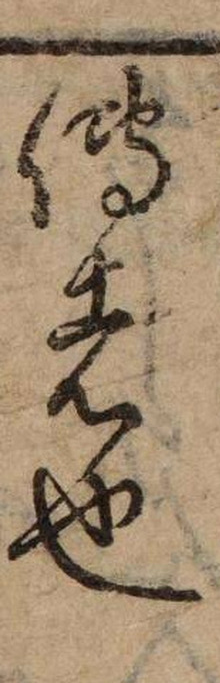伝者也
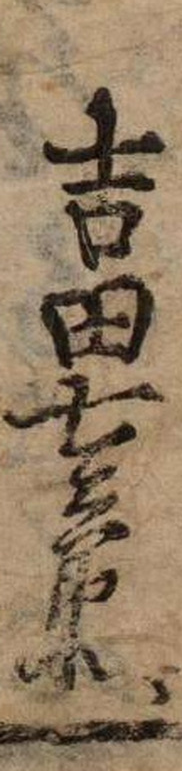吉田七兵衛
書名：塵劫記（寛永11年自跋、京都府立京都学・歴彩館追貴8）
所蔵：京都府立京都学・歴彩館 国文学研究資料館
